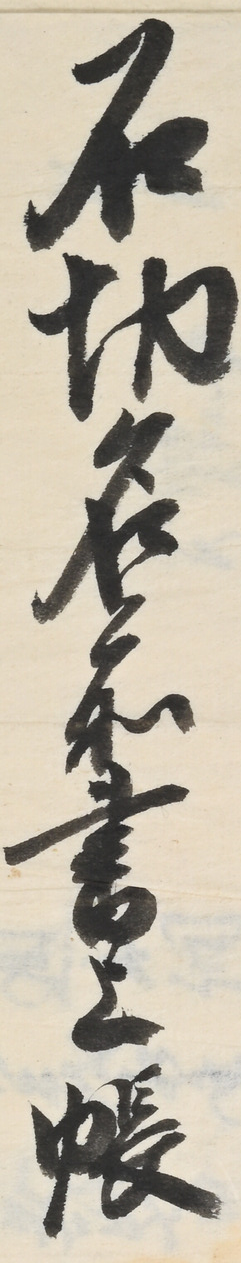石切名前書上帳
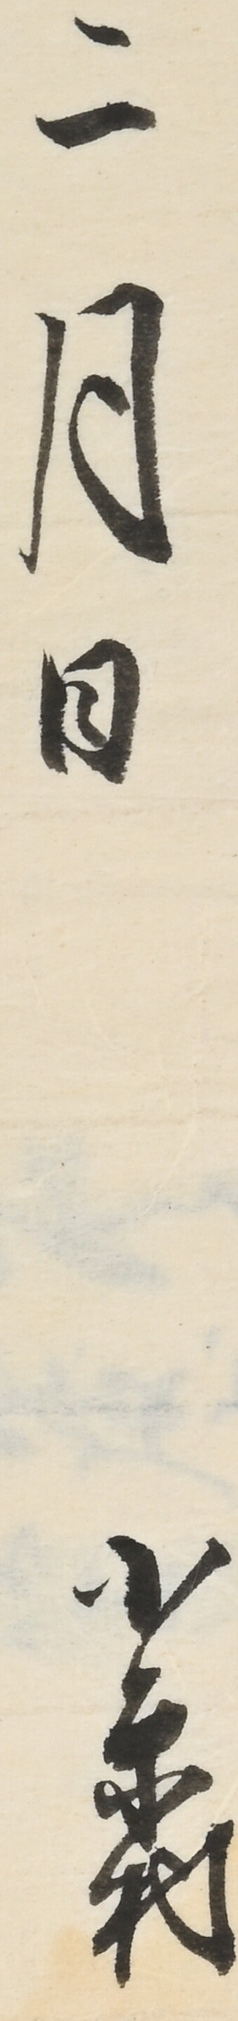二月日小原村

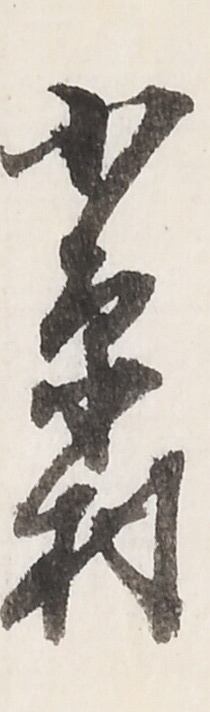小原村
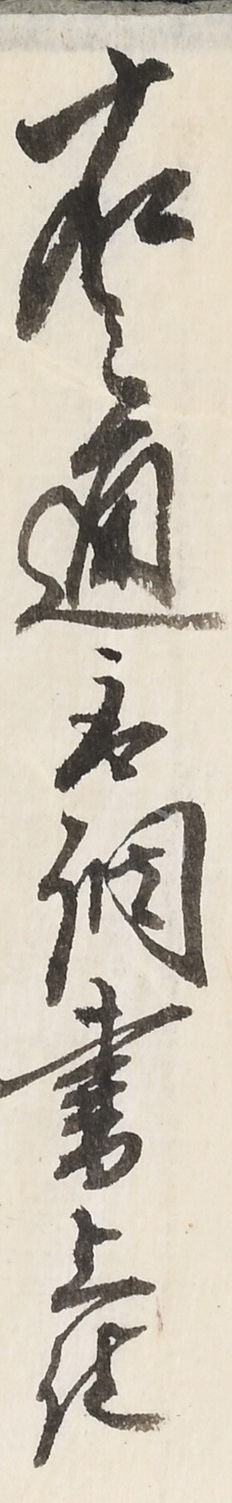右之通取調書上仕
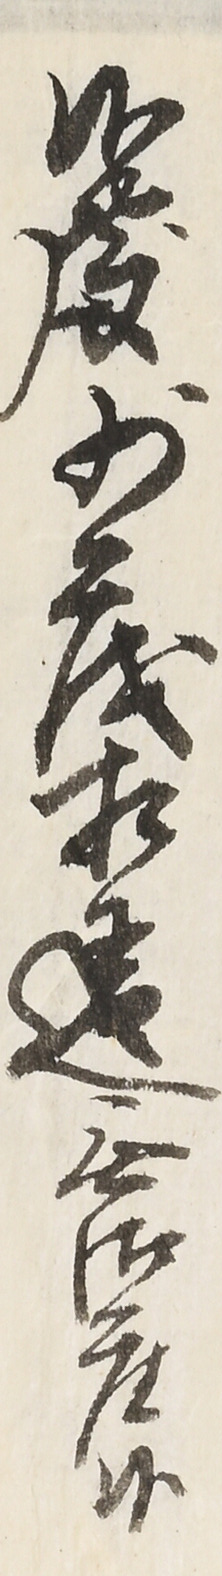候処少も相違無御座候
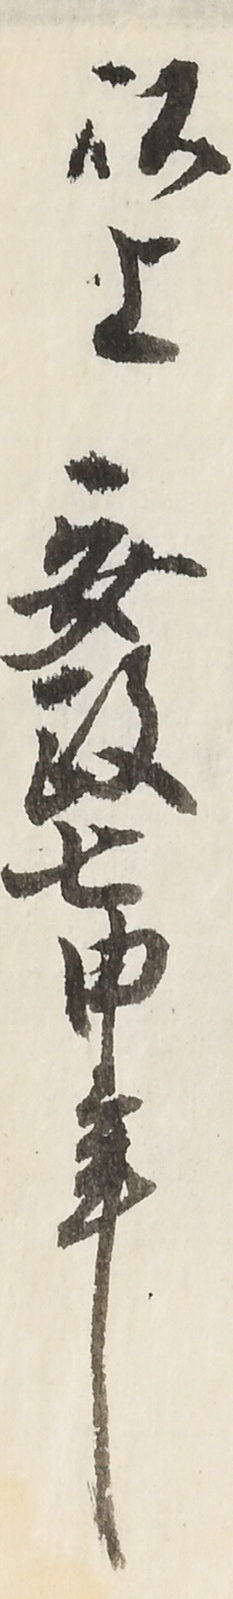以上安政七申年

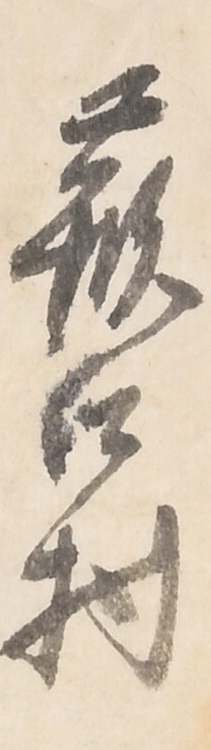荊口村
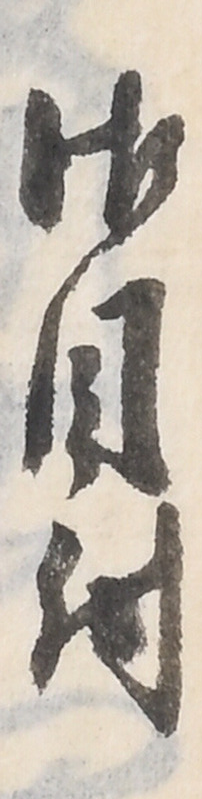御目付
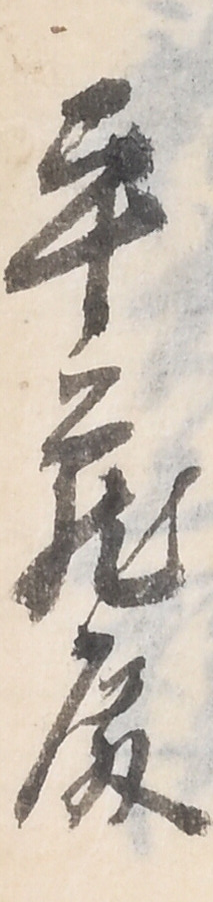平蔵殿
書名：安政七庚申年二月日石切名前書上帳
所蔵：伊那市立高遠町図書館・合同会社AMANE
